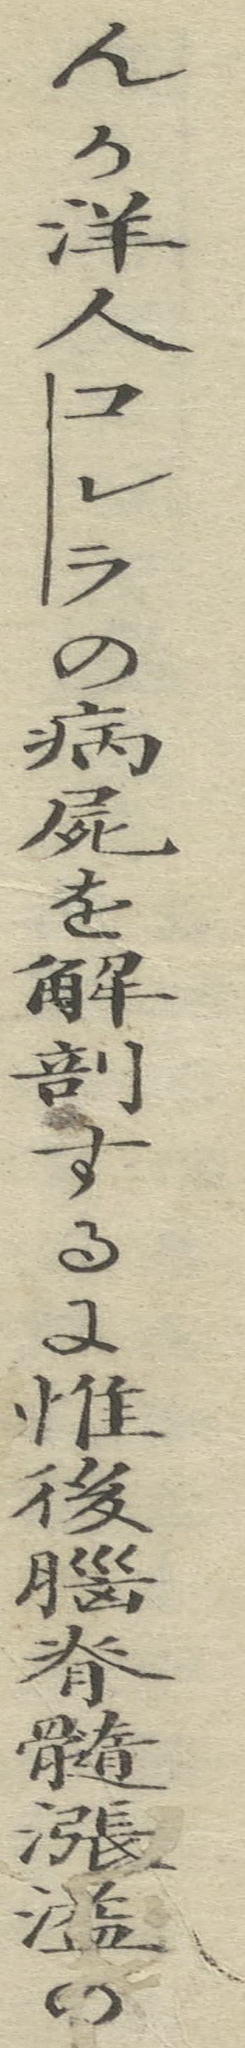んか洋人コレラの病屍を解剖するに惟後脳脊髄漲溢の
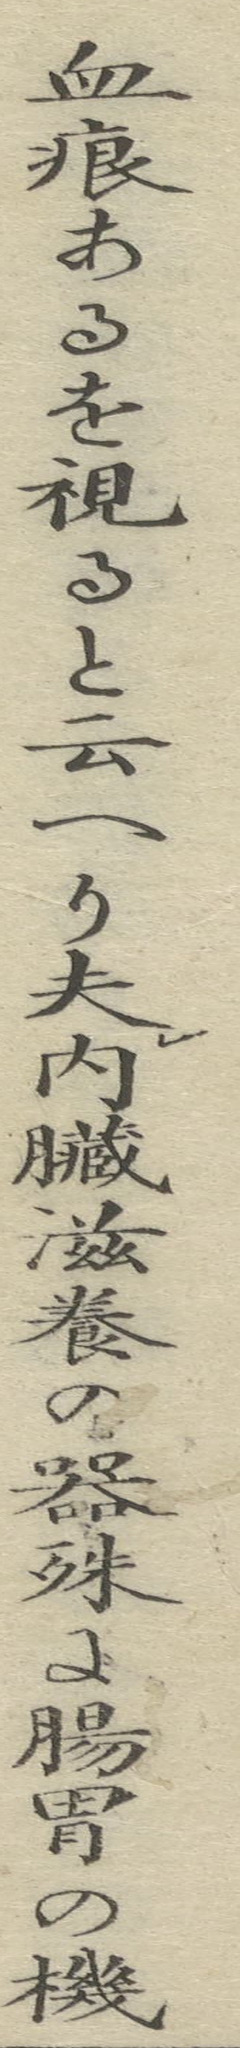血痕あるを視ると云へり夫内臓滋養の器殊に腸胃の機
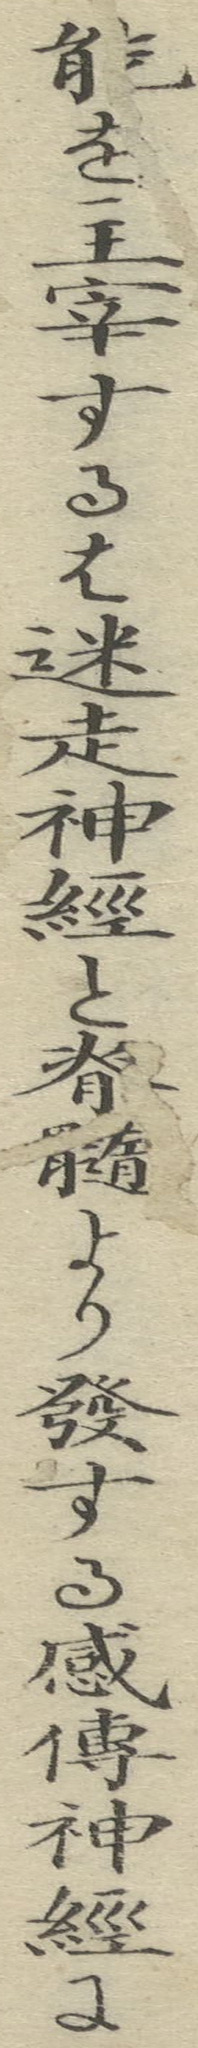能を主宰するは迷走神経と脊髄より發する感傅神経に
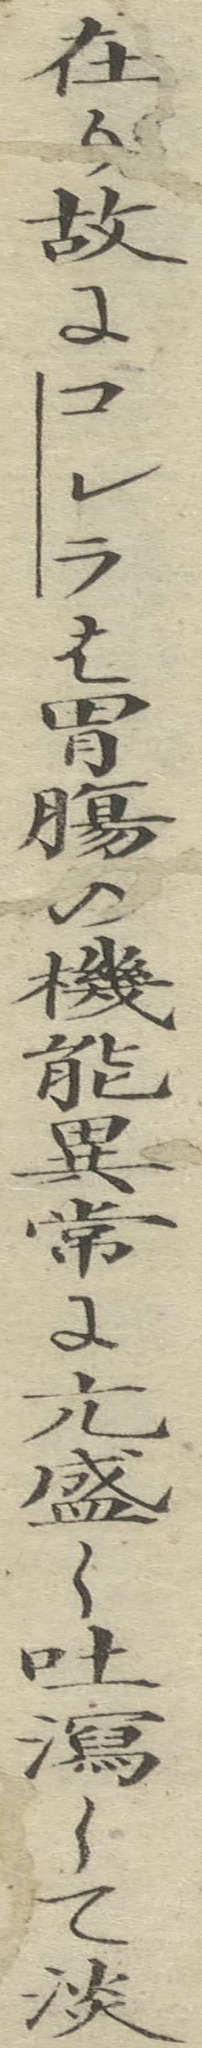在り故にコレラは胃腸の機能異常に亢盛し吐瀉して淡
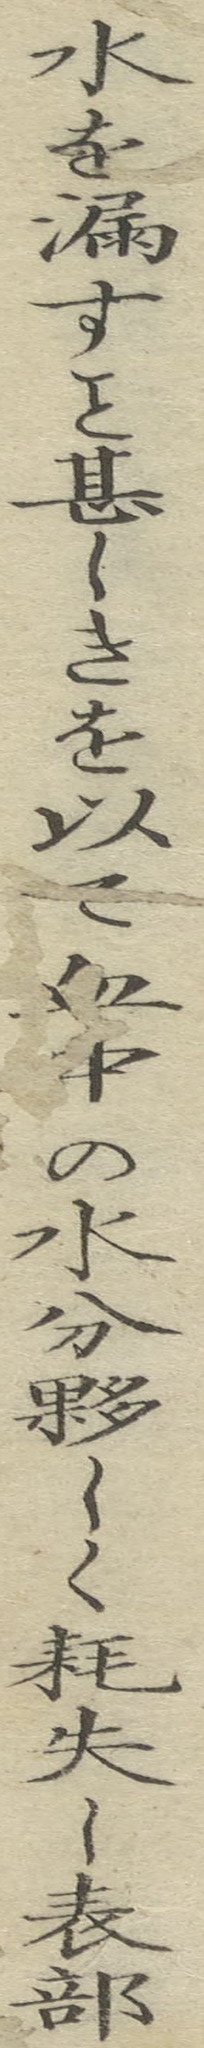水を漏すこと甚しきを以て血中の水分夥しく耗失し表部

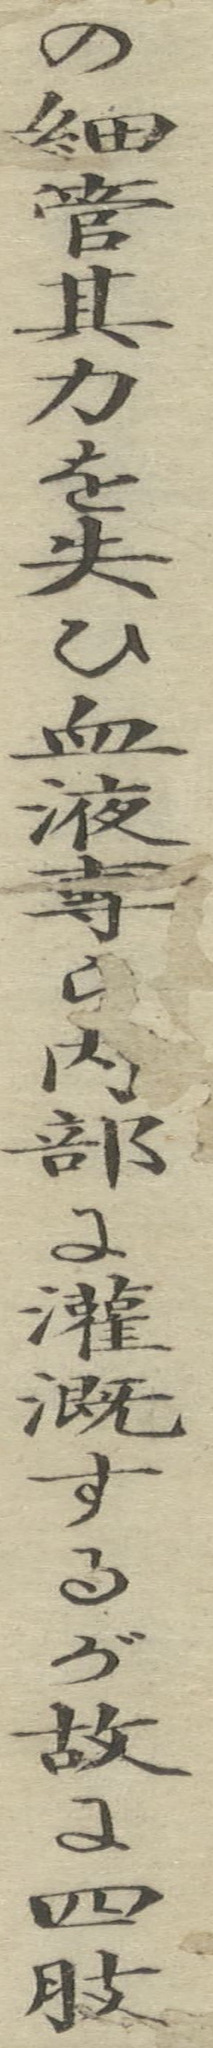の細管其力を失ひ血液内部に灌漑するが故に四肢
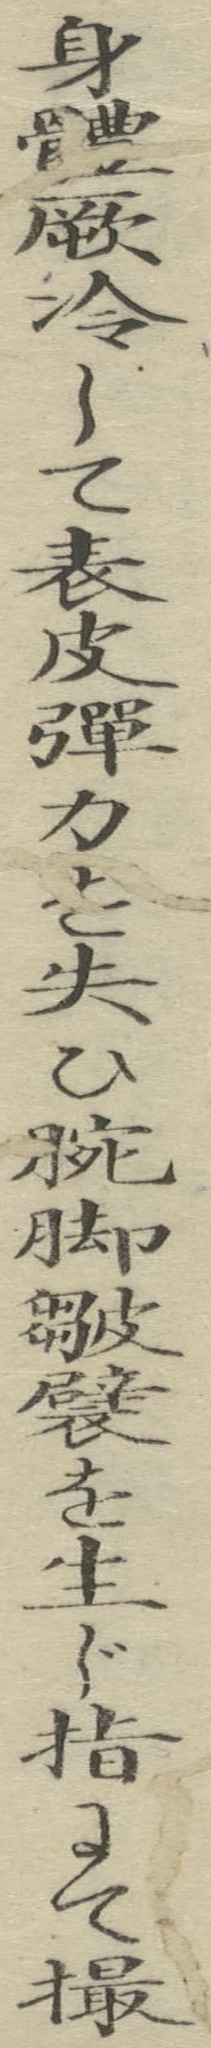身體厥冷して表皮弾力を失ひ腕脚皺襞を生じ指にて撮
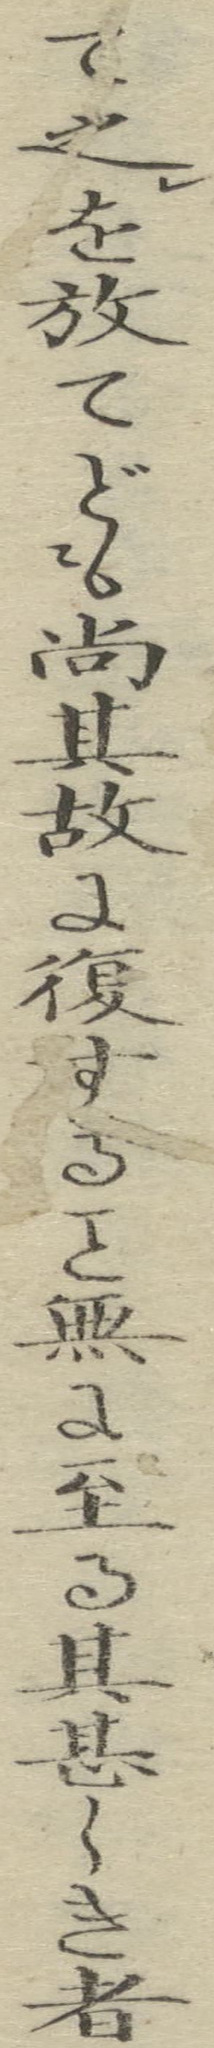て之放てども尚其故に復すること無に至る其甚しき者
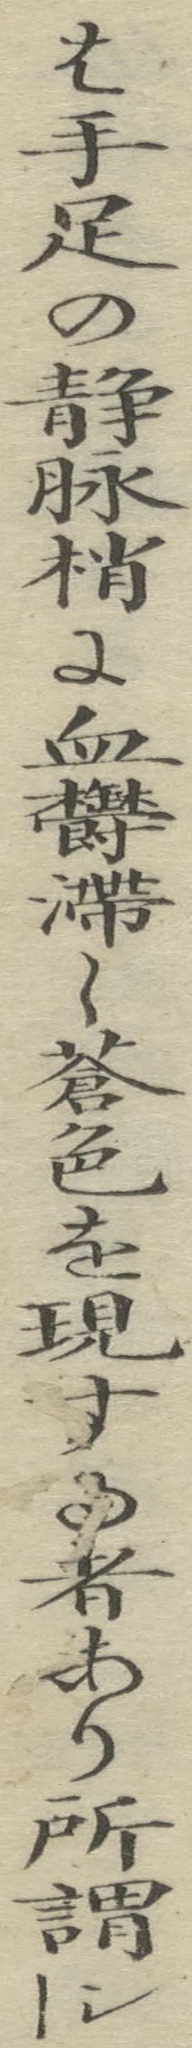は手足の静脉梢に血欝滞し蒼色を現する者あり所謂シ
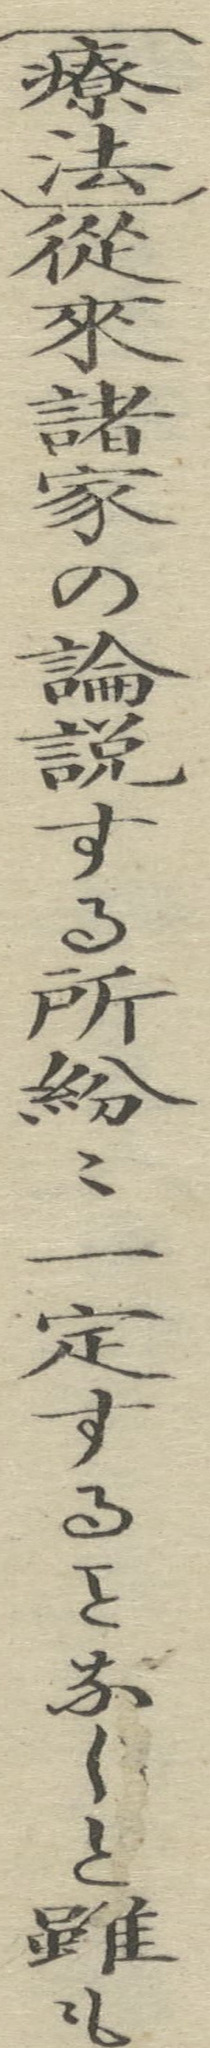[療法]従来緒家の論説する所紛々一定することなしと雖も
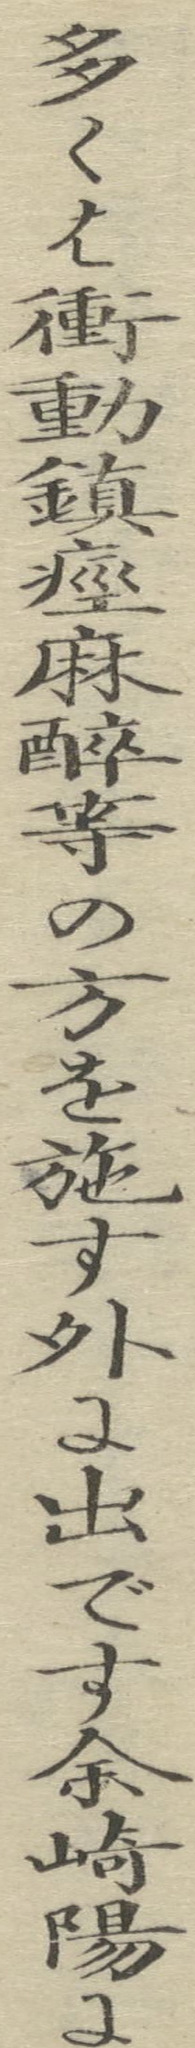多くは衝動鎮痙麻酔等の方を施す外に出です余埼陽に
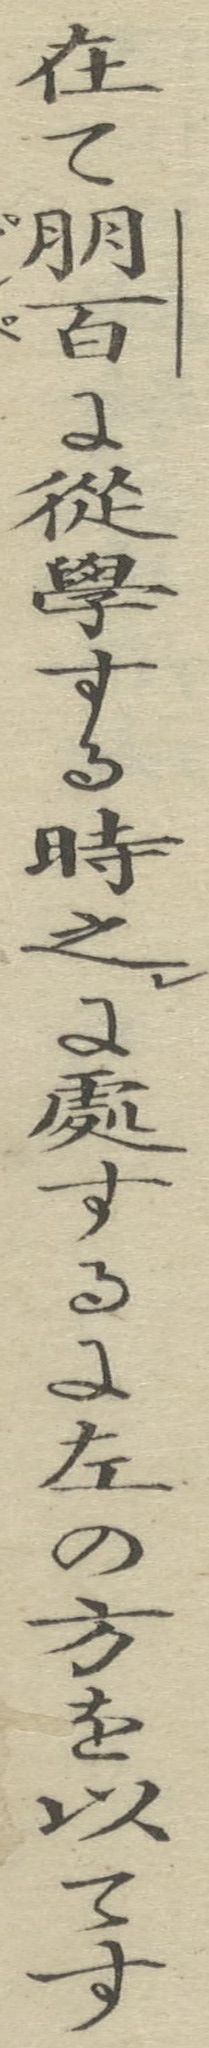在て朋百に従學する時之處するに左の方を以てす
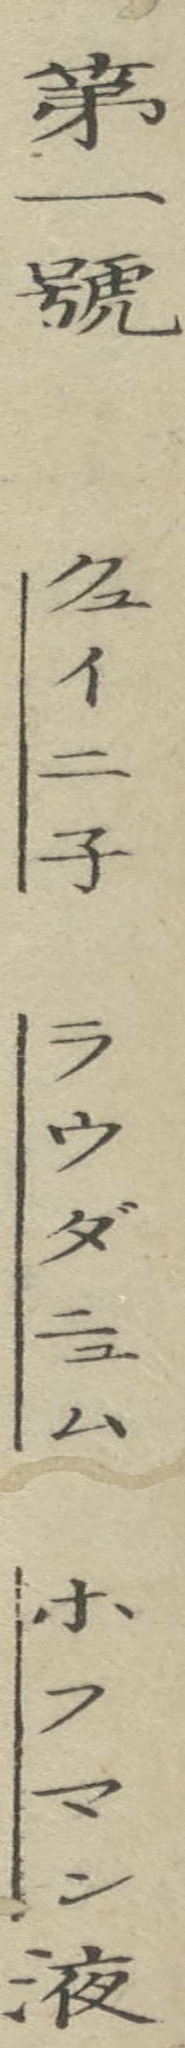第一號クュイニエラウダニュムホフマン液
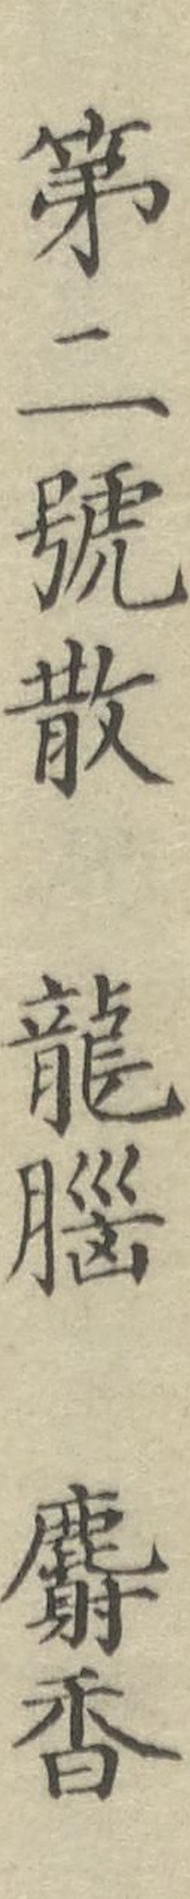第二號散龍脳麝香
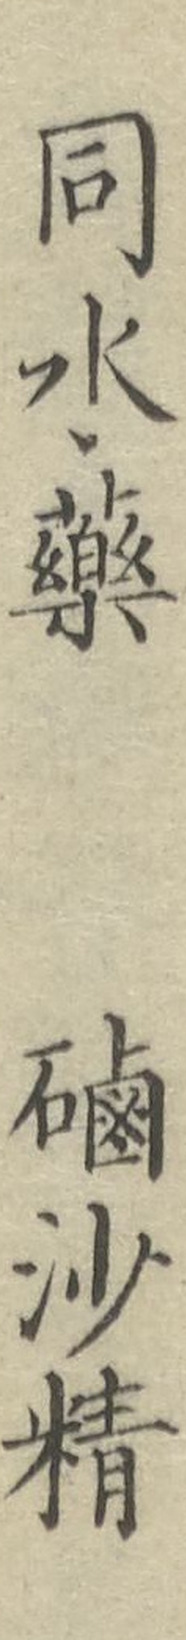同水藥磠沙精
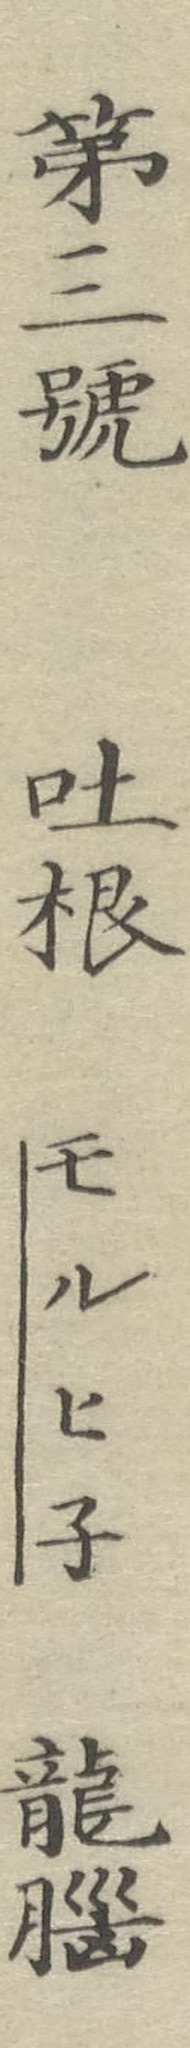第三號吐根モルヒネ龍脳
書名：官版疫毒預防説　全
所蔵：東京大学総合図書館 General Library in the University of Tokyo, JAPAN
